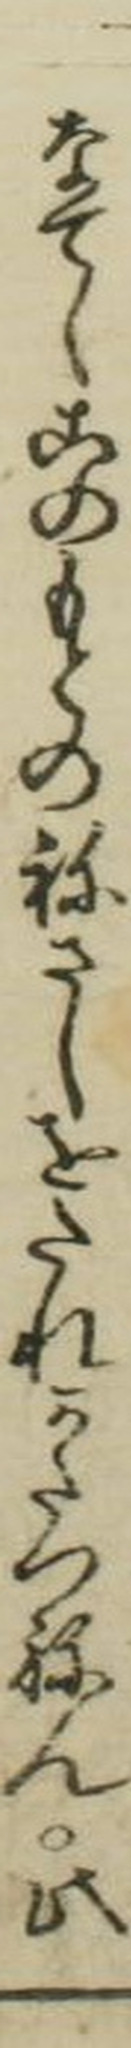なてしこのもとのねさしをたれかたつねん○此
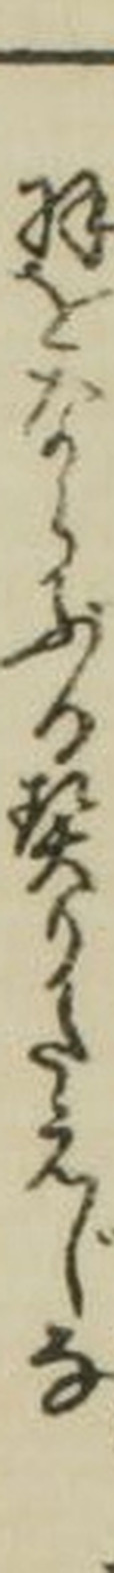羽をならぶる契りたえじなしらず
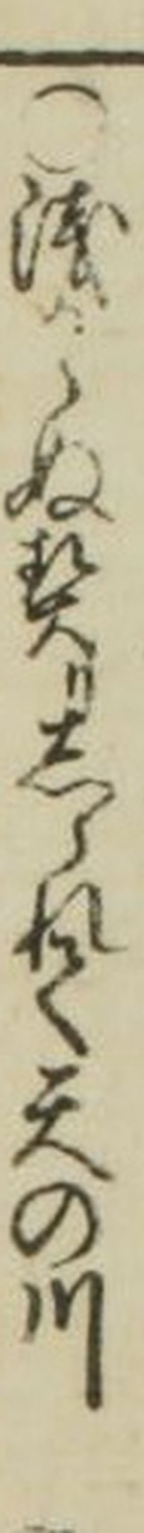○浅からぬ契りしられて天の川雅景
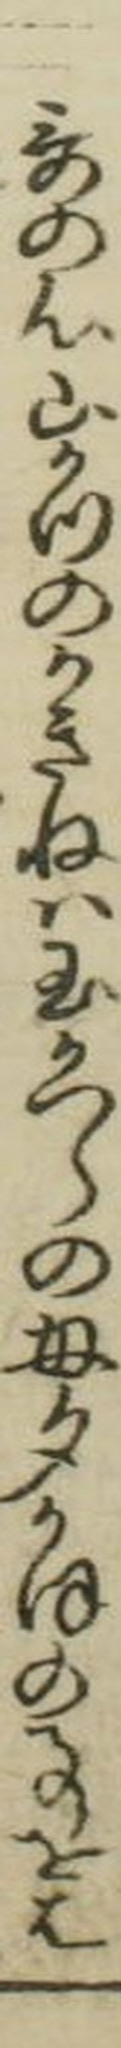哥の心山かつのかきねは玉かつらの母夕かほの事をは
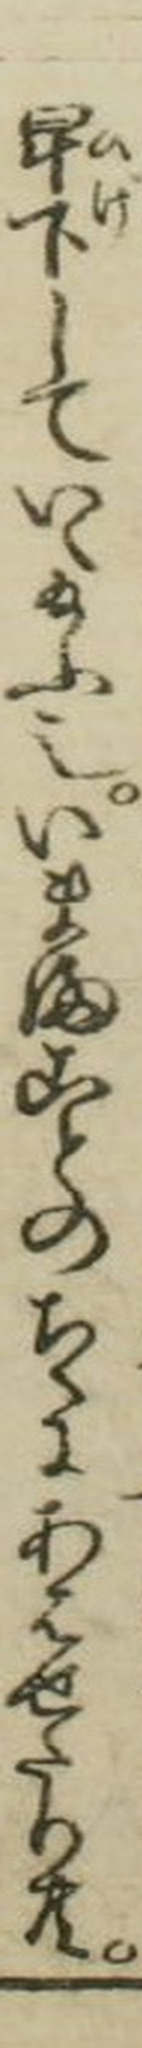卑下していゝ給ふ也。いままことのちゝにあはせたり共。
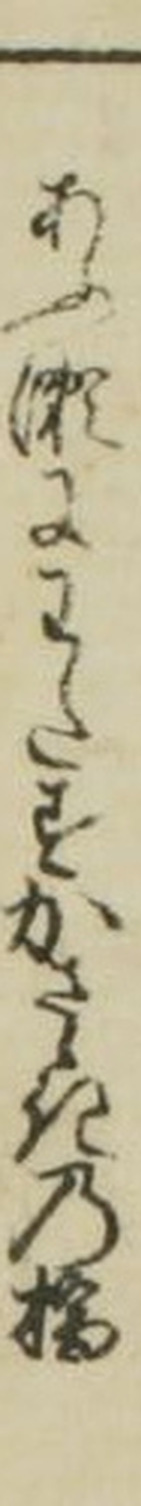あふ瀬にわたすかさゝきの橋
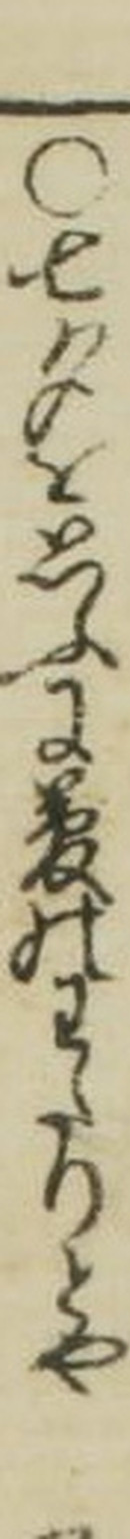○七夕を思ふに夢のわたりとや通茂
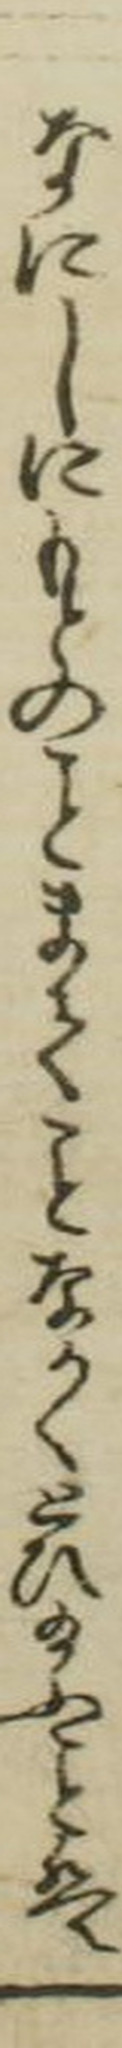なにしにもとのことまてことなかくとひ給ふことは
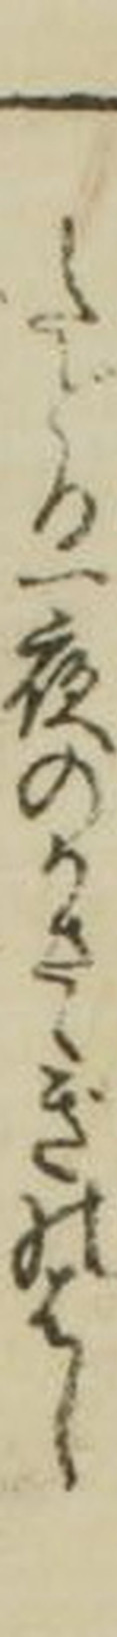たどる一夜のかさゝぎのはし
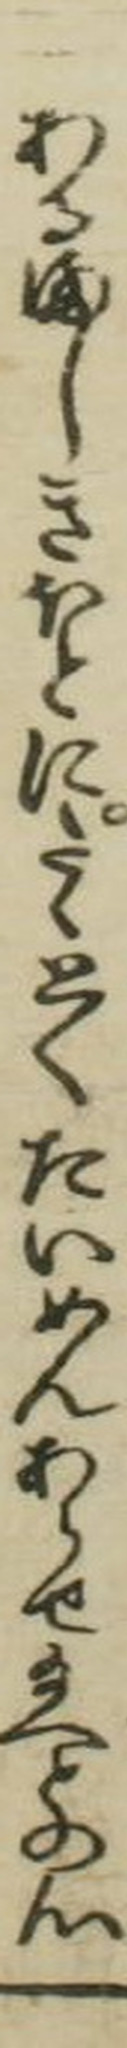あるましきほとに。たゝとくたいめんあらせ給へとの心
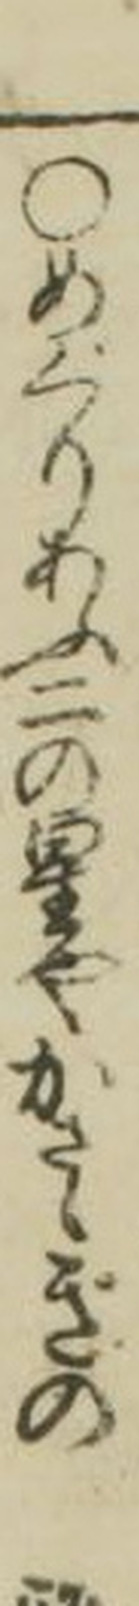○めぐりあふ二の星やかさゝぎの雅喬
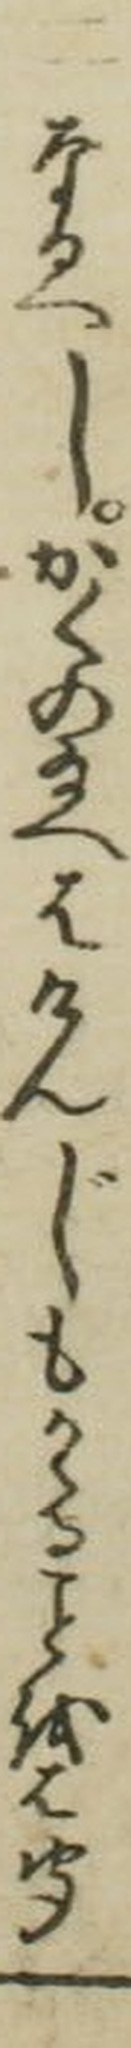なるへし。かくの給へはけんじもかゝることをは聞
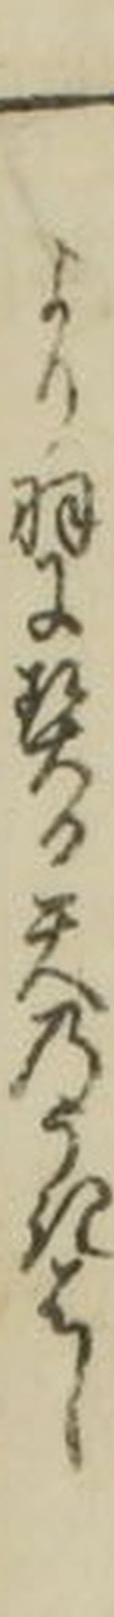より羽に契る天のうきはし
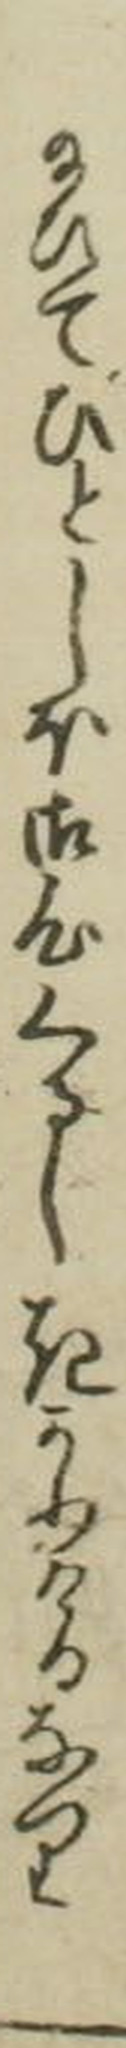給ひて。ひとしほ御心くるしきかりけるなり
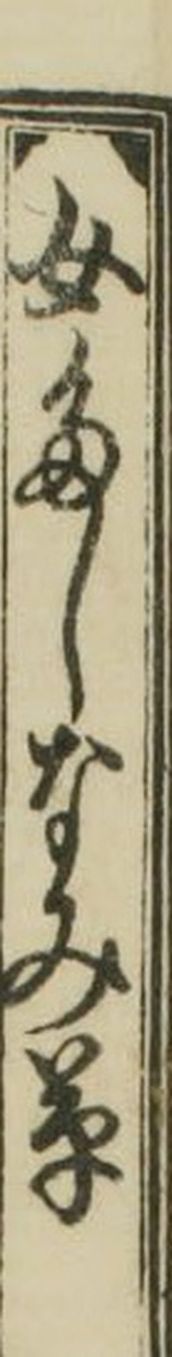「女たしなみ草
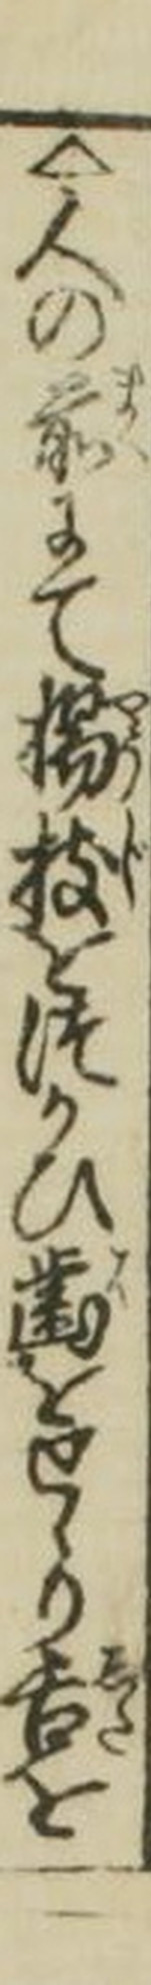△人の前にて楊枝をつかひ歯をせゝり舌を
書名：女源氏教訓鑑
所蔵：東京学芸大学附属図書館
